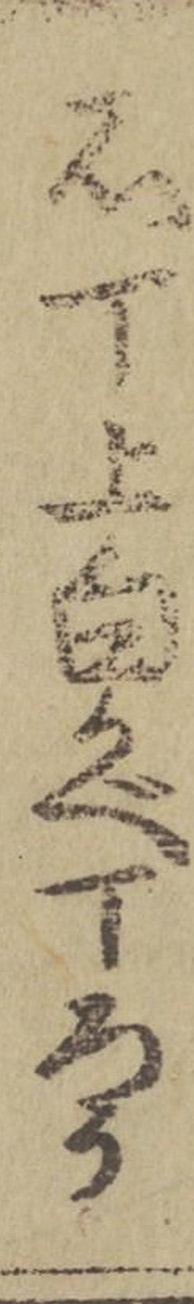石丁上白かべ丁ろう
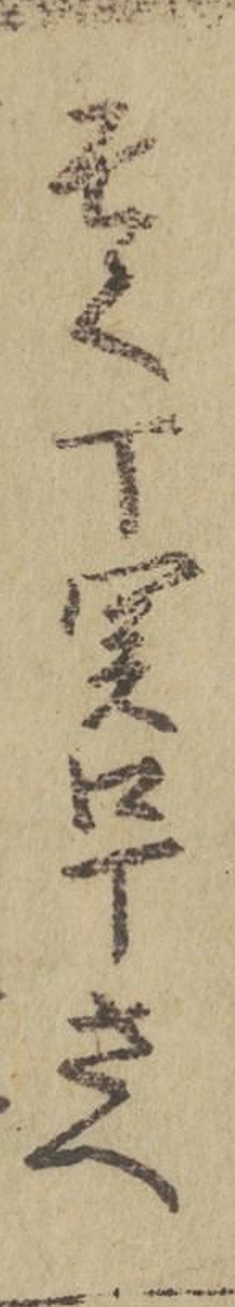そく丁関口丁さへ
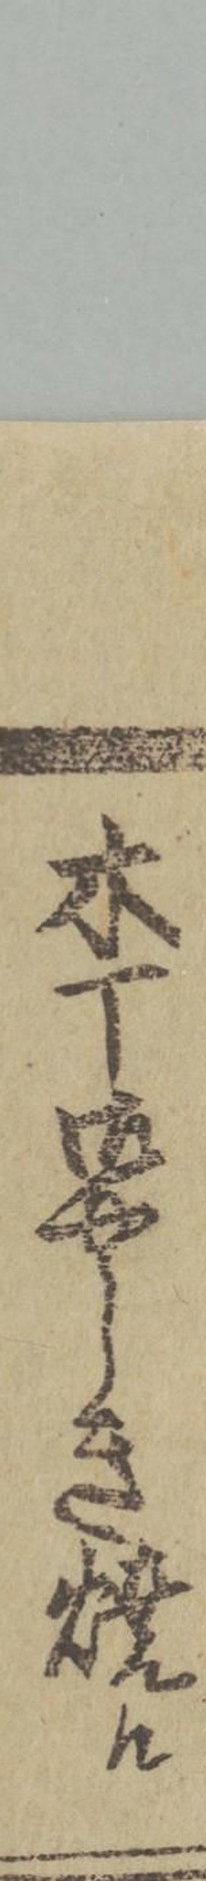木丁御やしき焼ㇽ
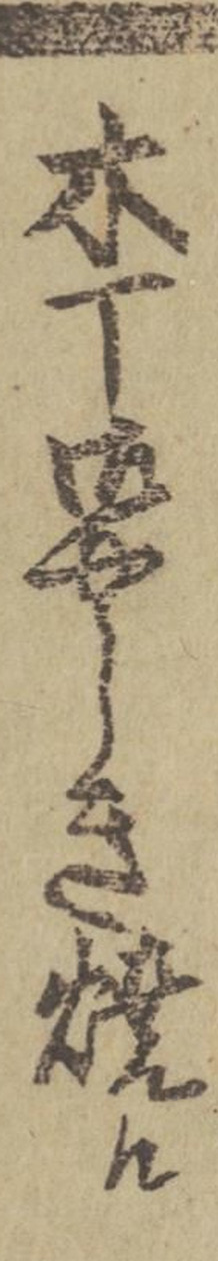木丁御やしき焼ㇽ
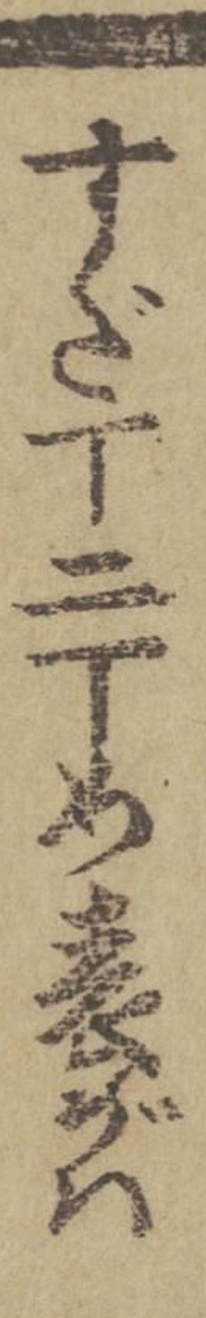すだ丁二丁め表がは
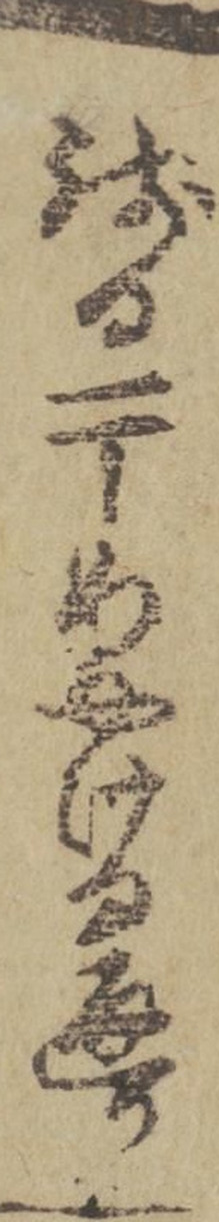残る一丁めやける通り
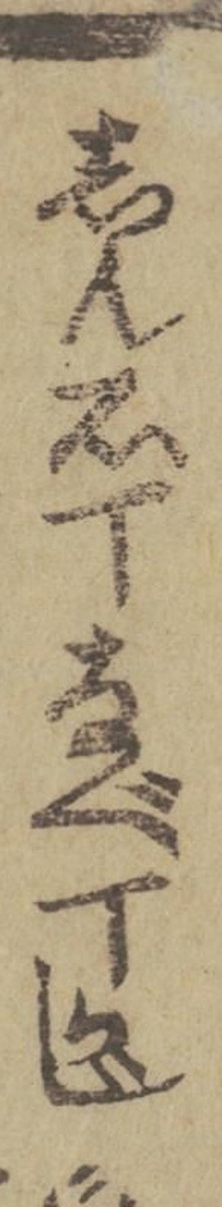しん石丁なべ丁かじ
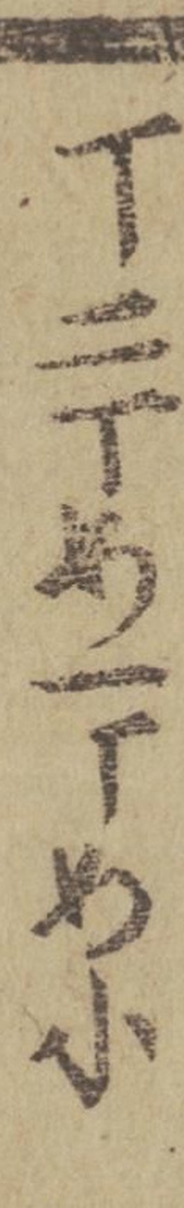丁二丁め一丁め小
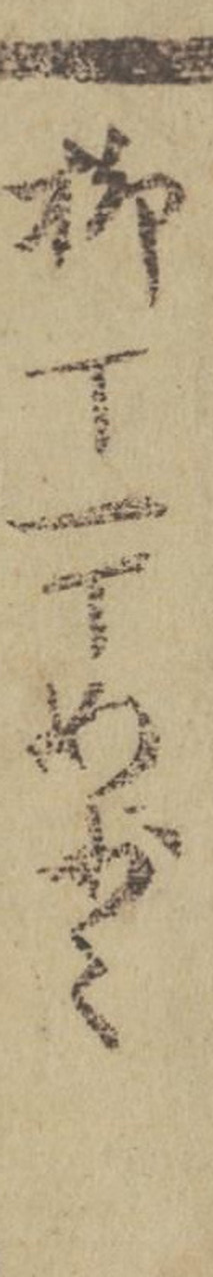柳丁一丁め少々
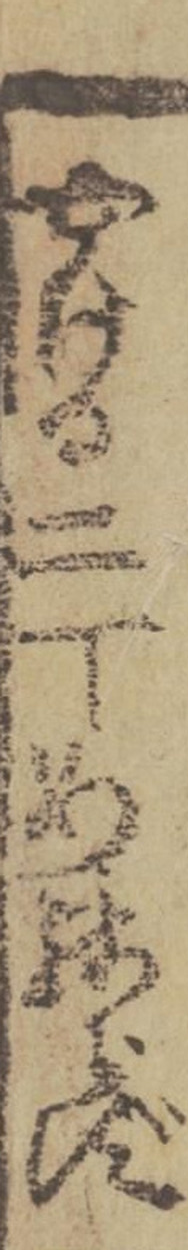やける二丁め残らず
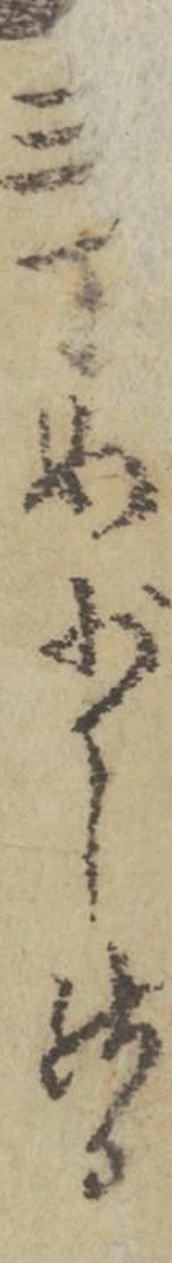三丁め少し残る
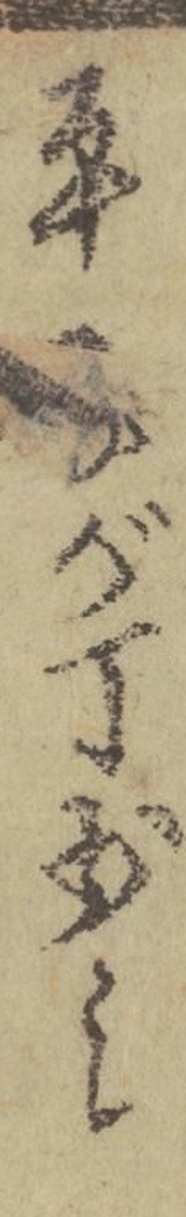平なが丁少し
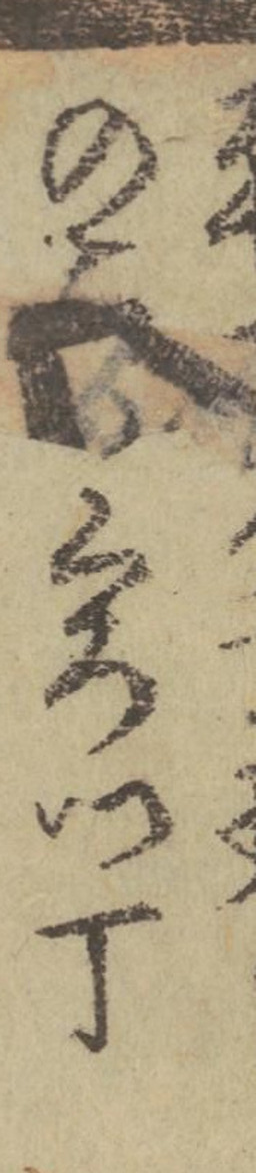のこるくろ門丁
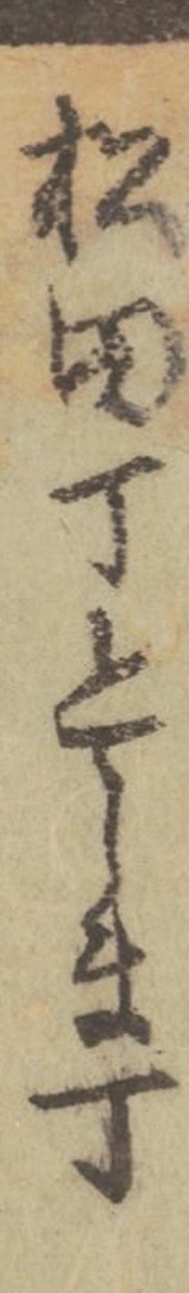まつだ丁としま丁
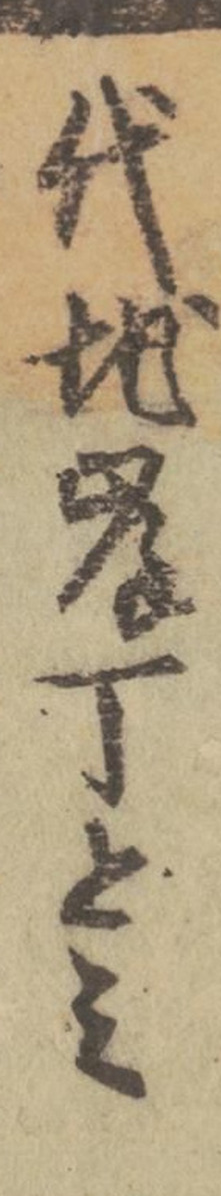代地岸丁とみ
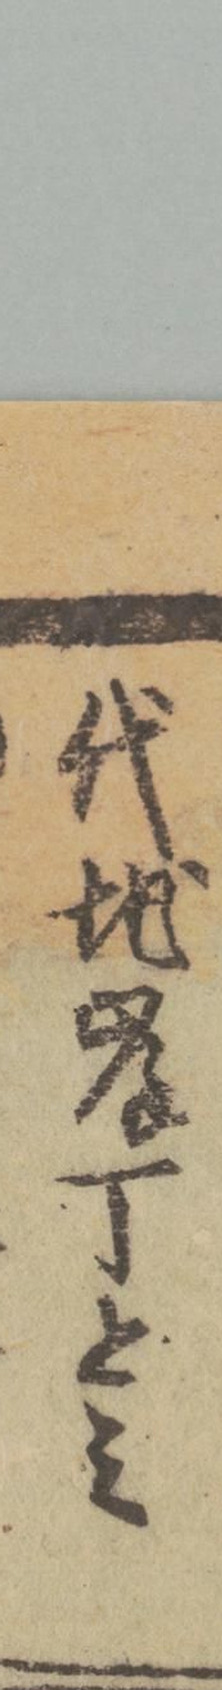代地岸丁とみ
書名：[安政元年十二月の江戸大火に関する瓦版]
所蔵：東京大学地震研究所図書室 Earthquake Research Institute Library, The University of Tokyo, JAPAN
